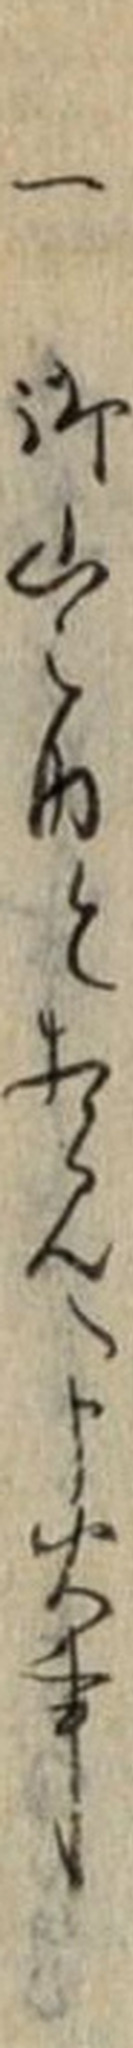一御山之内と相見へ申火事
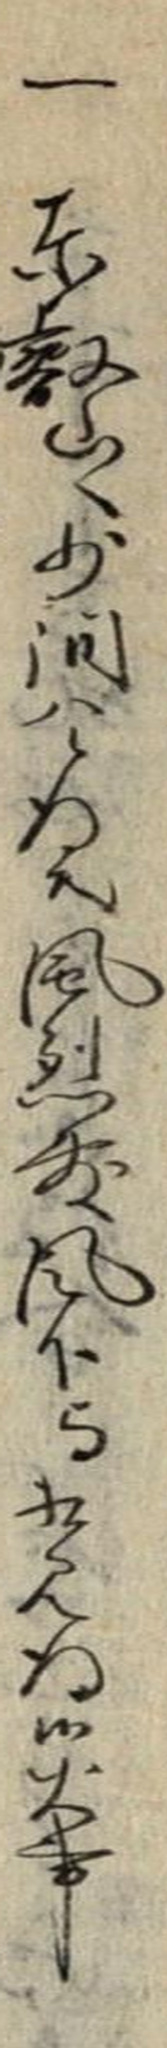一東叡山へ少間は候得共風烈敷風下と相見得候火事
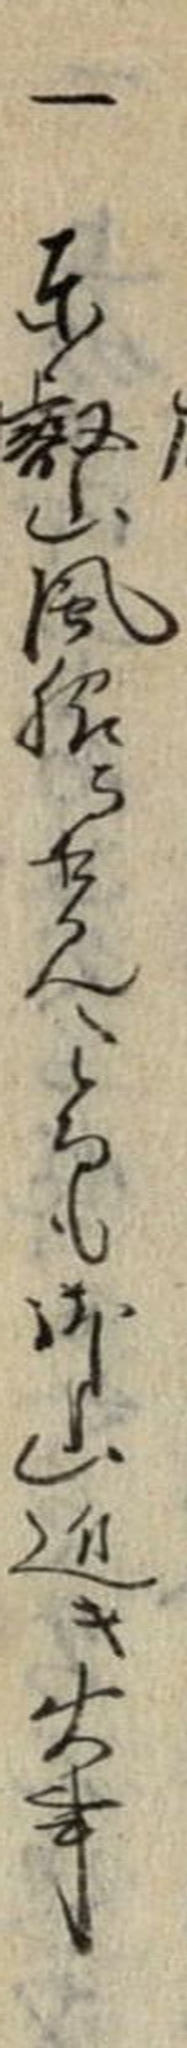一東叡山風脇と相見へ候ても御山近き火事
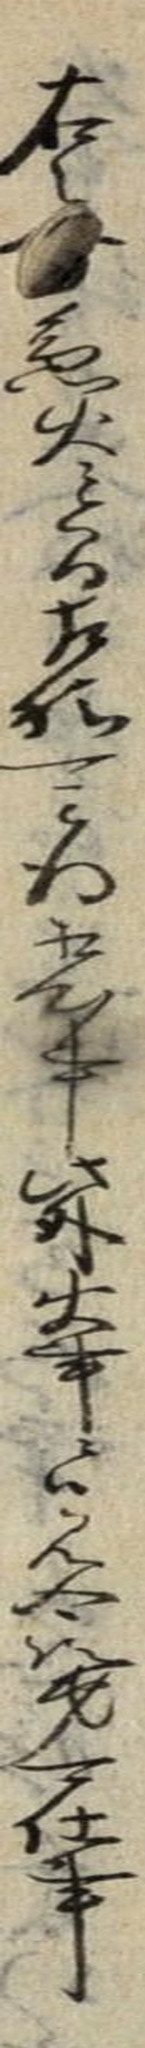右之急火に候間左様可被得相心事此外火事に見合次第可仕事
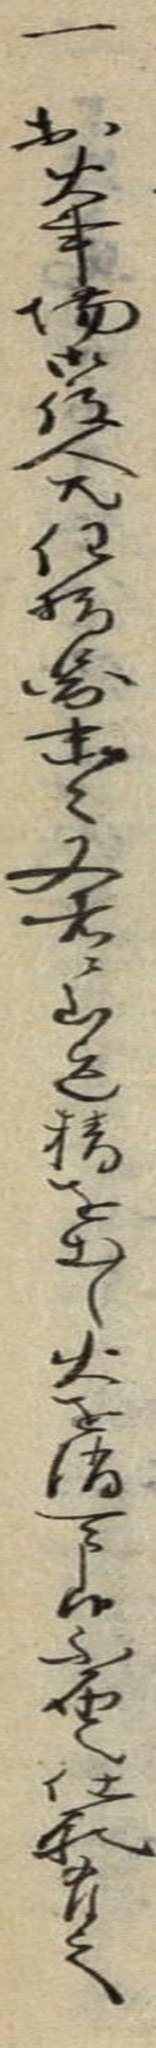一於火事場御役人共任指図末々又者に至迄精を出し火を消可申候不届之仕形有之
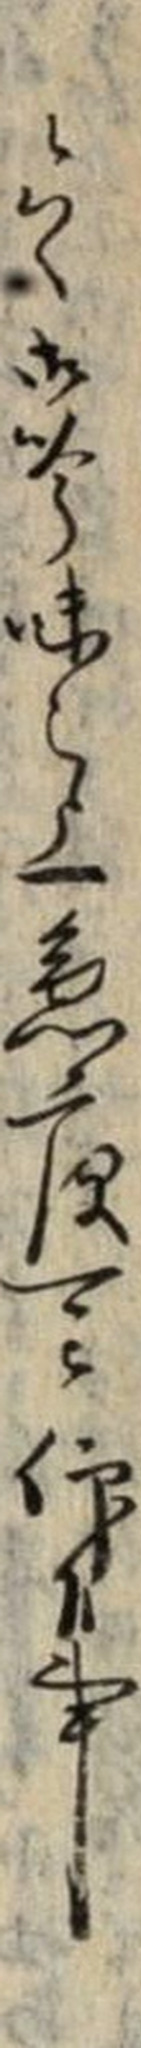候はゝ御吟味之上急度可被仰付事
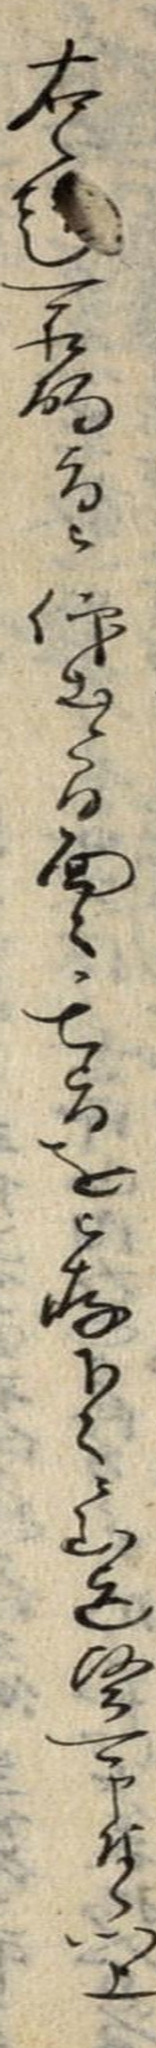右之趣可相触旨被仰出候間面々其旨を被存下々に至迄堅可申付候以上
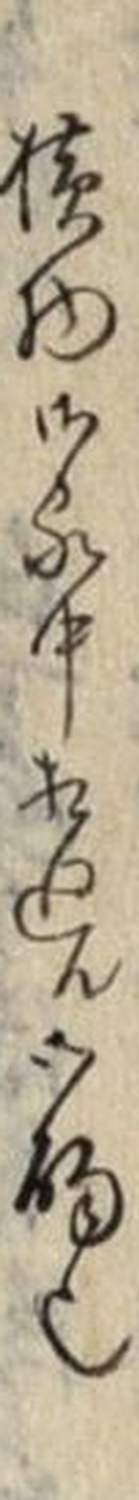横物御家中相廻る御触也
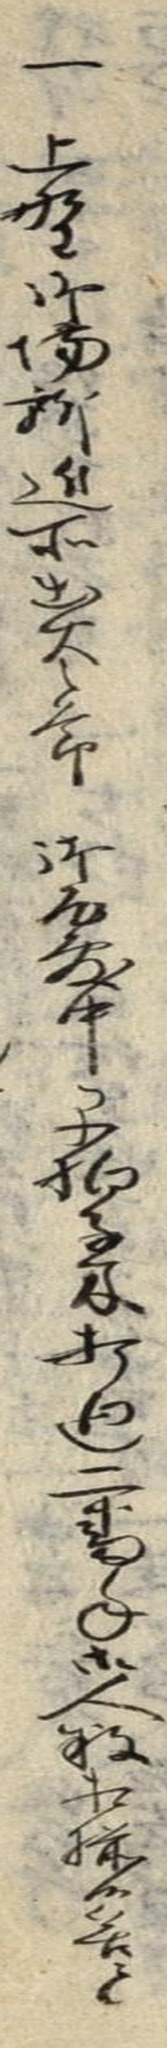一上野御場所近所出火之節御屋敷中早拍子木打廻二番手御人数相揃候筈に候
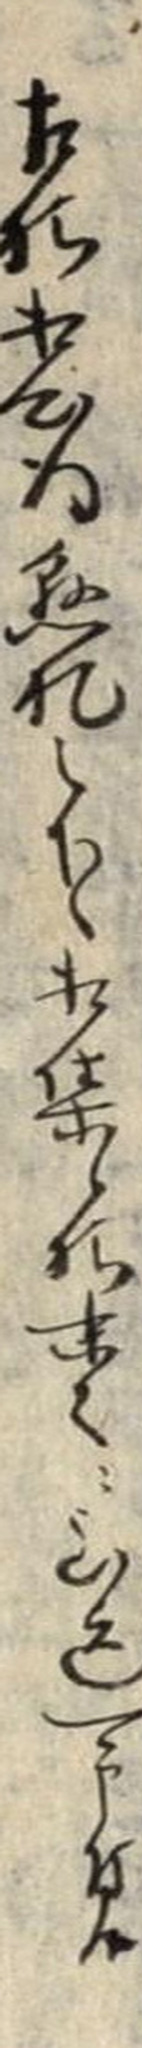左様相心得懸札之下へ相集候様末々に至迄可申付候
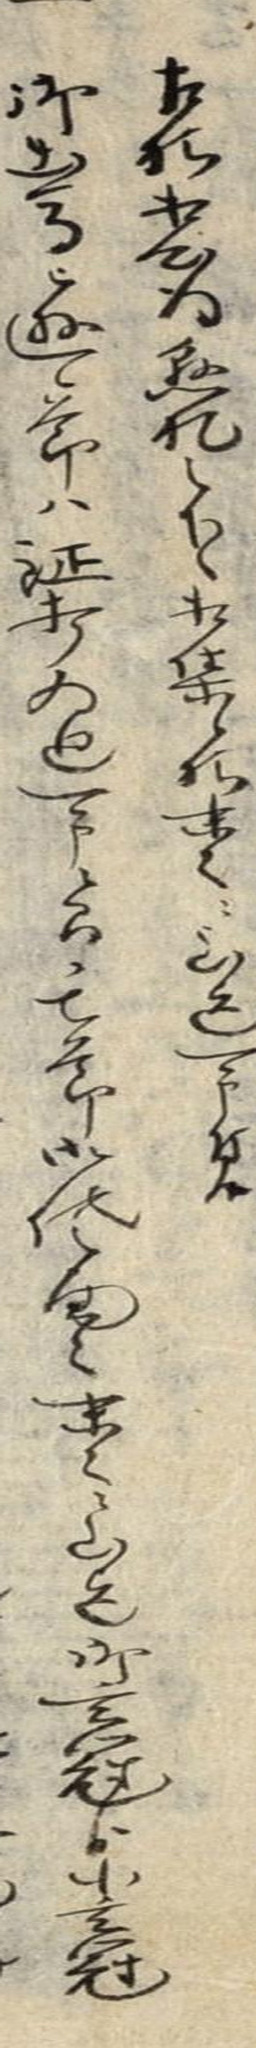一御出馬被遊候節は鉦打為廻可申候間其節御供之面々末々に至迄御玄冠ゟ小玄冠
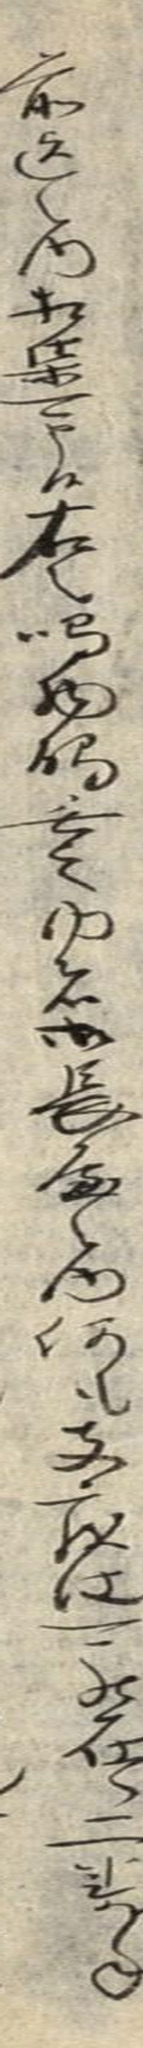前迄之内相集可申候右之鳴物触無之内は御長屋之内何も支度仕可罷在候二番手
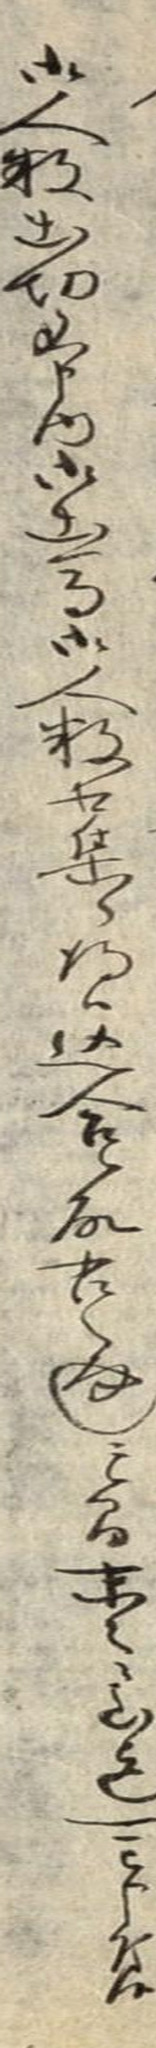御人数出切不申内御出馬御人数相集候得は込合候故右之通に候間末々に至迄可被申付候
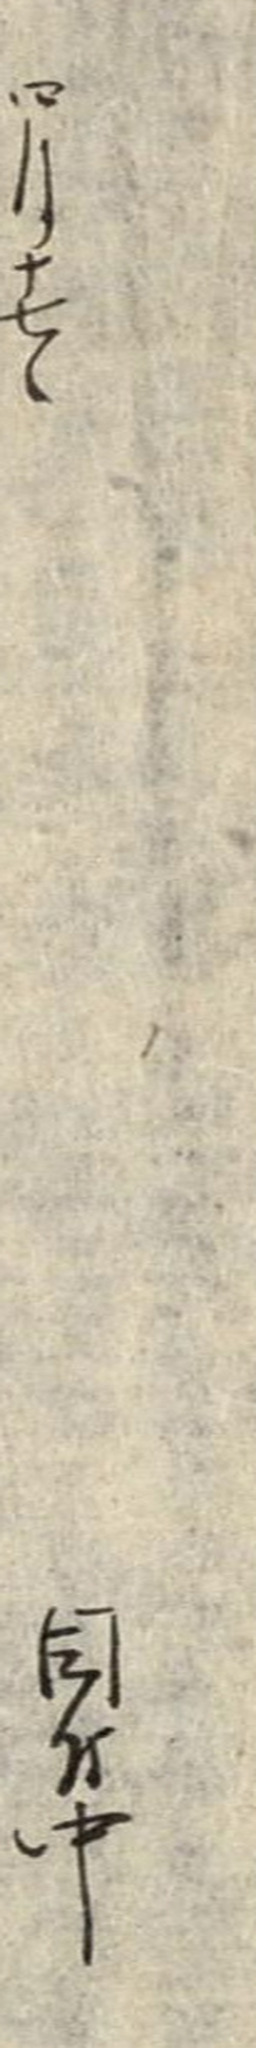四月十七日目付中
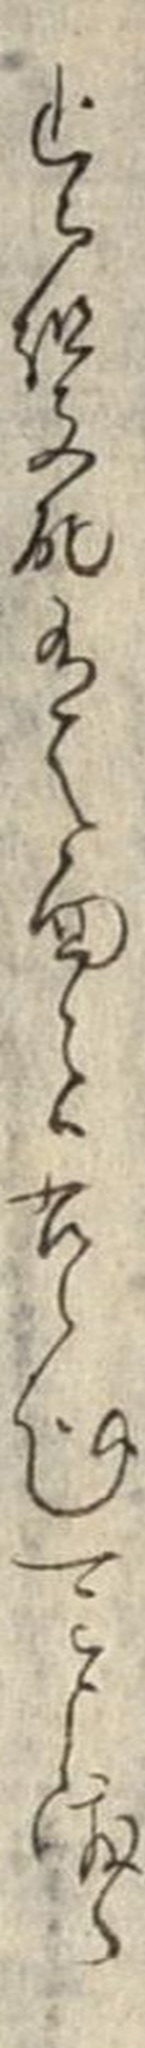追て組支配有之面々は右之趣可被申渡候

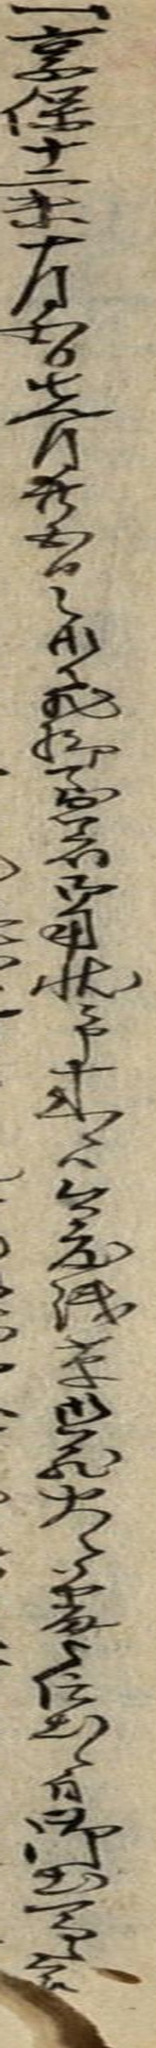一享保十二未十月五日先月廿五日之御飛脚到着御用状に申来候は今度浅草御蔵火之御番被仰出候に付御出馬之節
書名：三都并道中之部
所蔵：福井県文書館 Fukui Prefectural Archives
